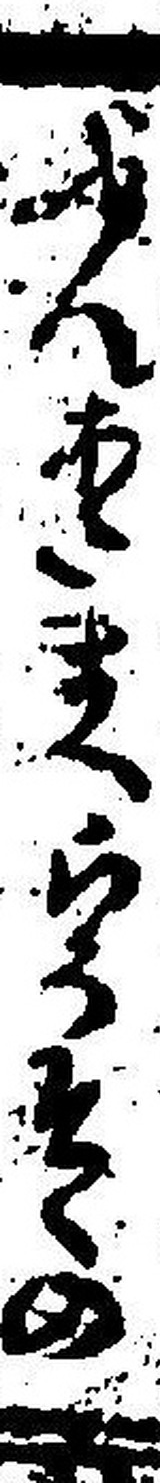ふんあたまへらうそくの
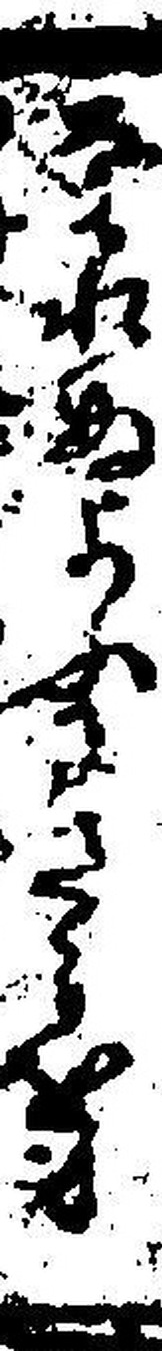なかれぬよふにさらをも
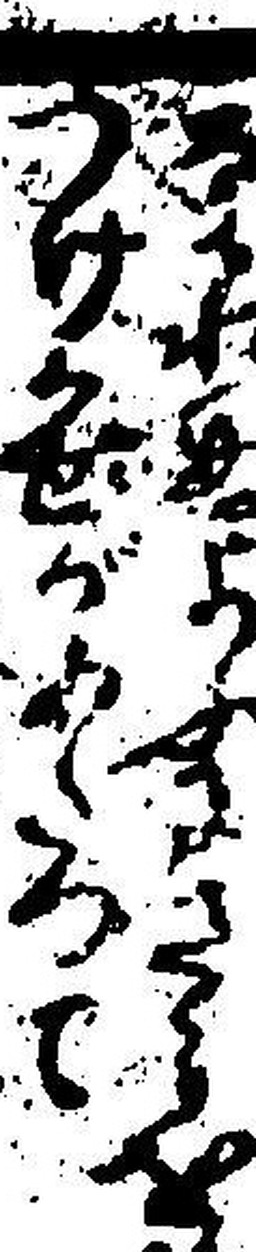つけかぜがあたつて
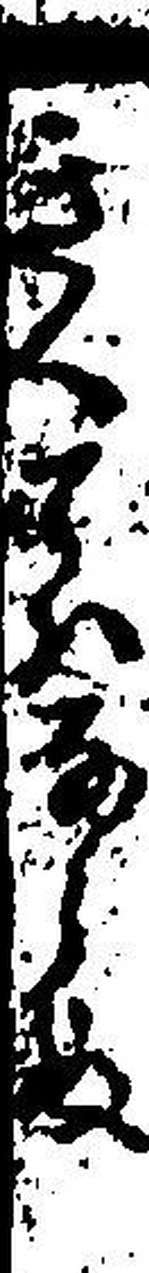きへてはならぬ
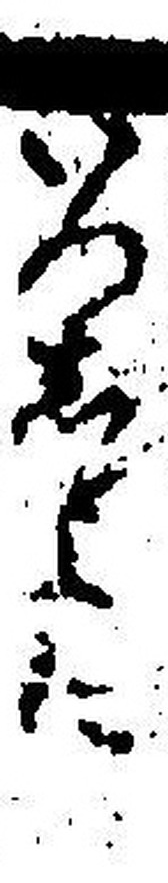いつしよに
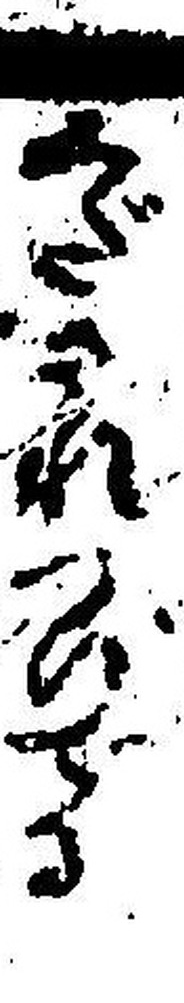くだされついでに
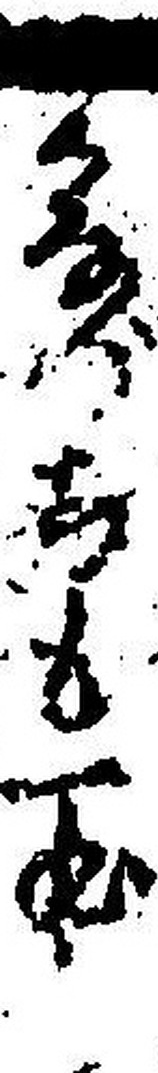かなづちも一本
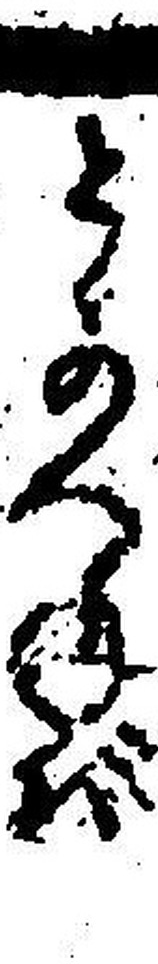とゝのへねば
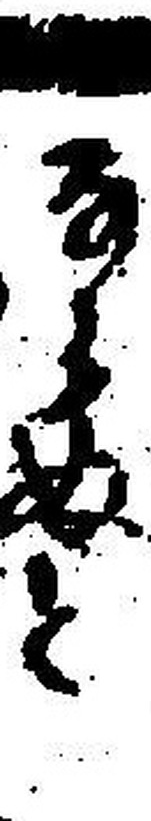ならぬと
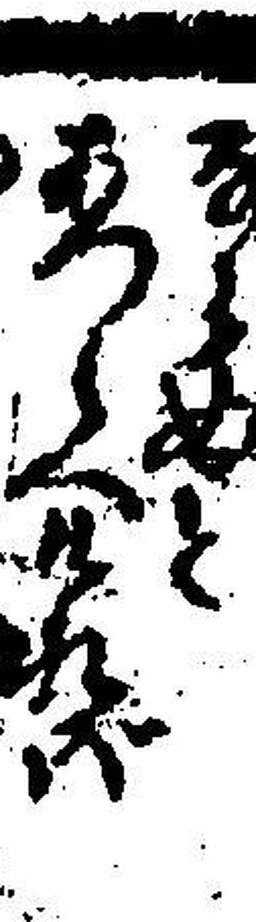あつらへければ
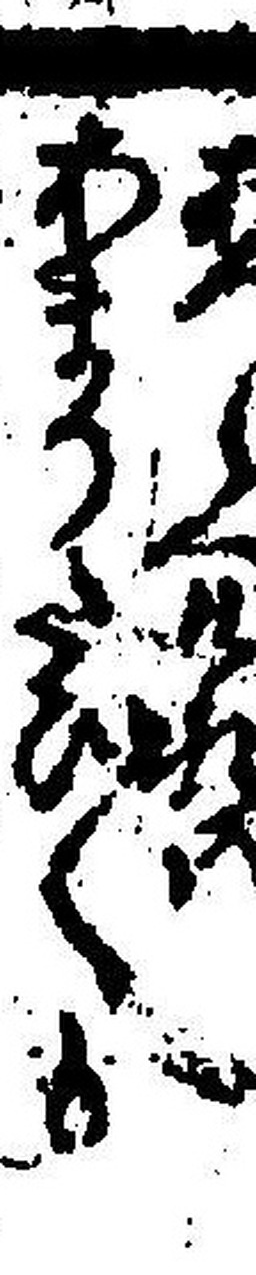あまりたび〳〵も
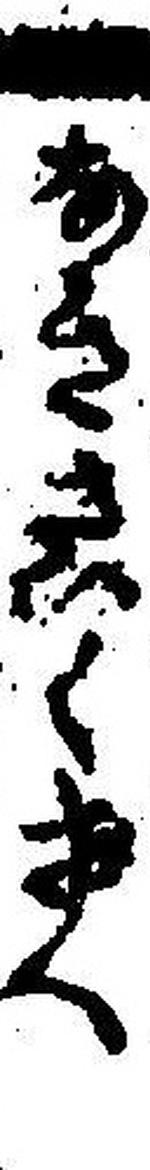なきさいくゆへ
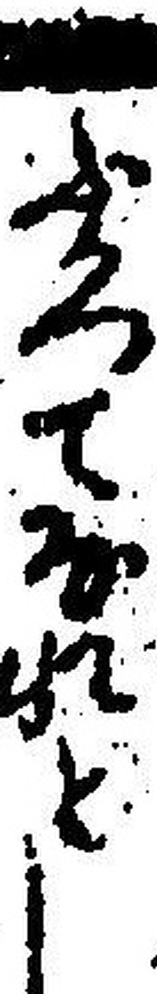ふかつてなれと
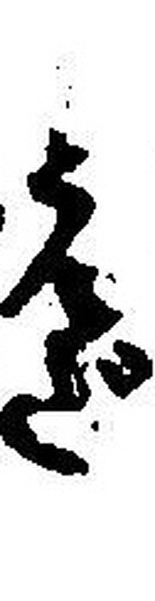とんだ
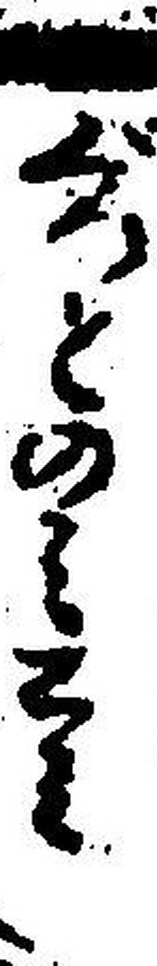くつとのみこみ
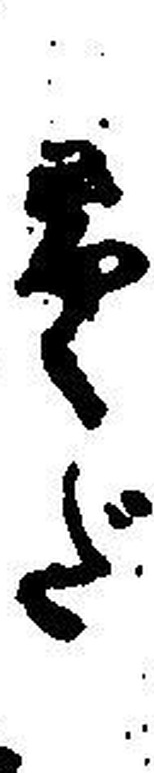きやくだ
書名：御代参牛時詣 / 市場通笑作
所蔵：東京大学総合図書館 General Library in the University of Tokyo, JAPAN
